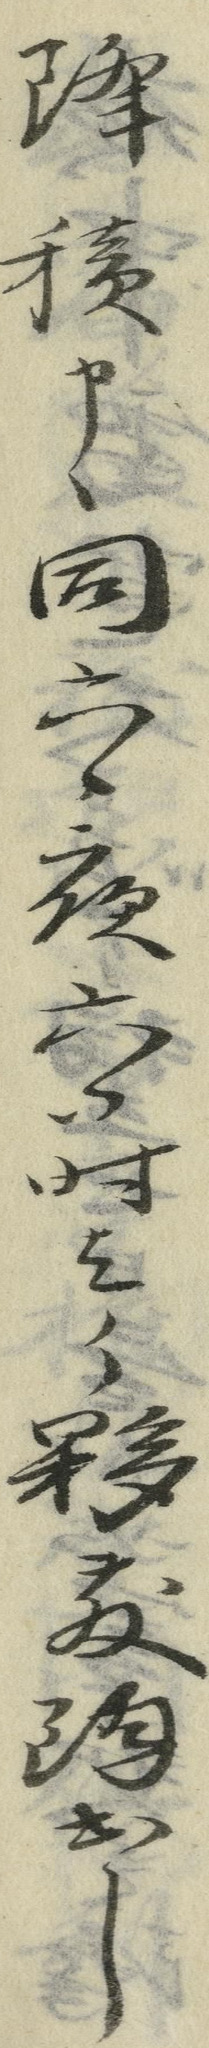降積申候同六日夜六ツ時より夥敷陶出し

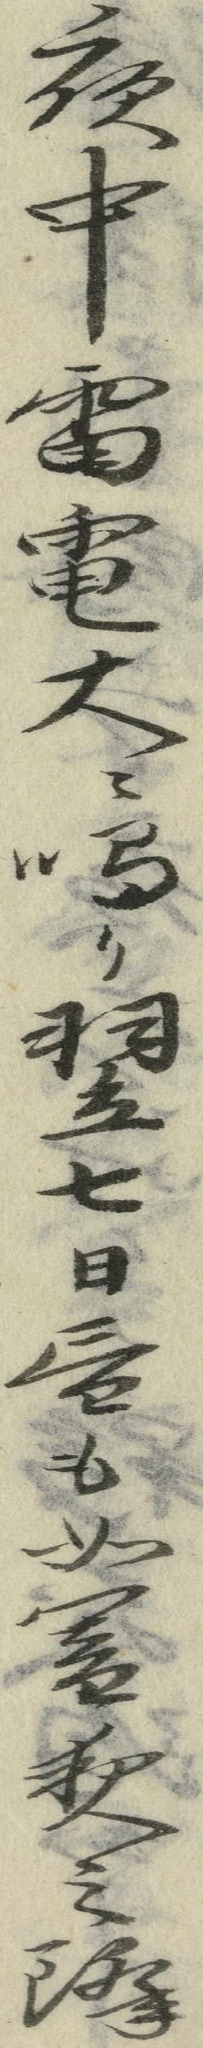夜中雷電大ニ鳴リ翌七日昼も如闇夜之降
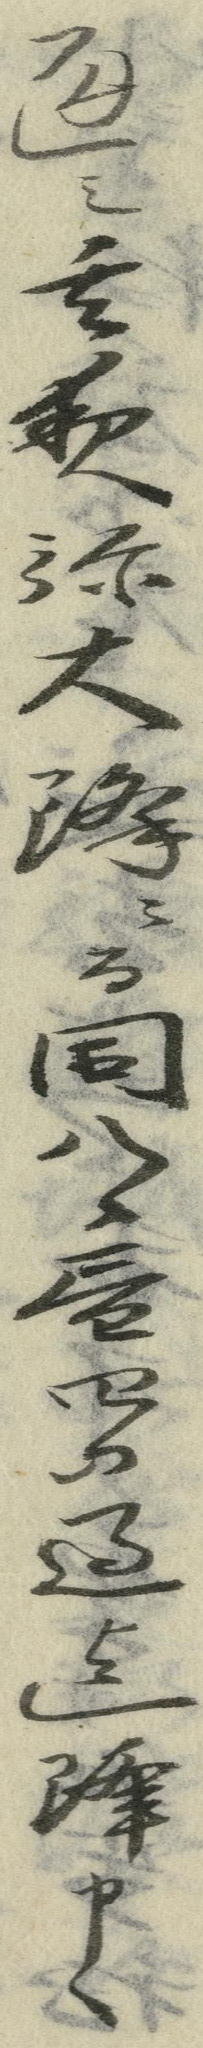通シ其夜弥大降ニ而同八日昼四ツ過迄降申候
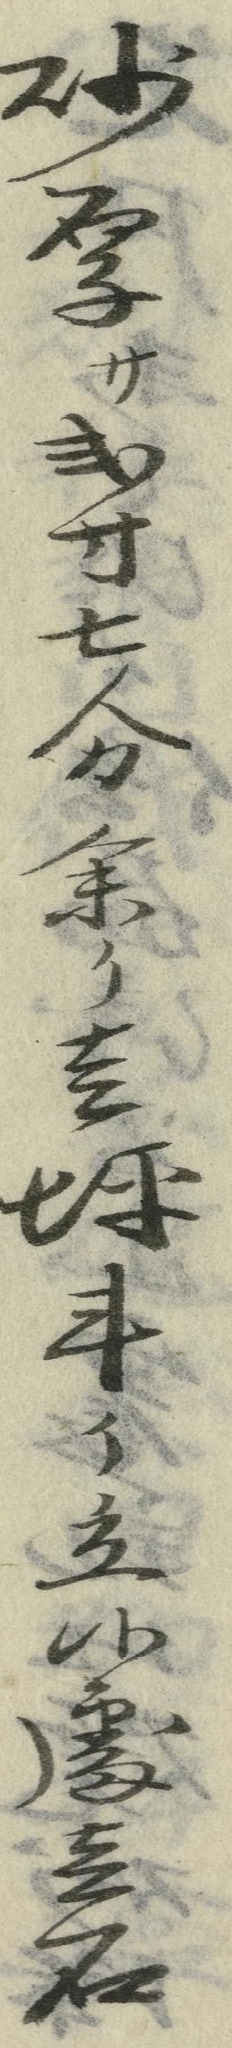砂厚サ弐寸七分余り壱坪斗リ立候処壱石
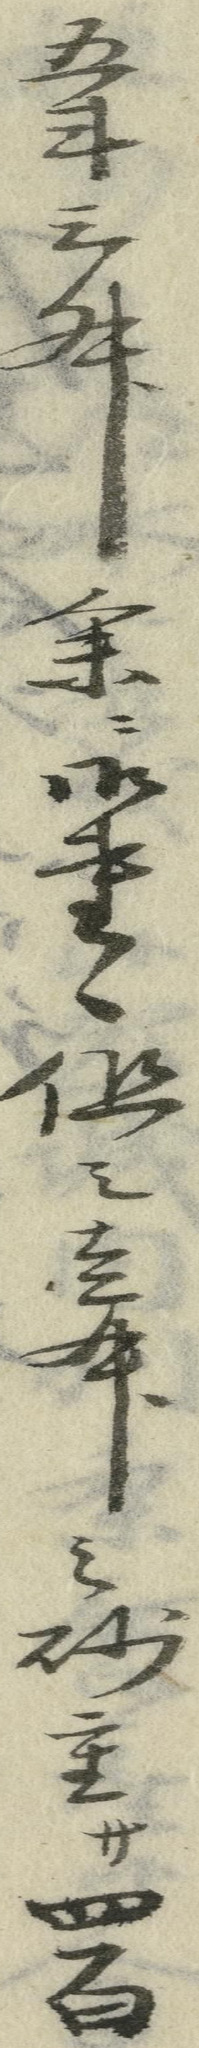五斗三升余ニ御座候但シ壱升之砂重サ四百
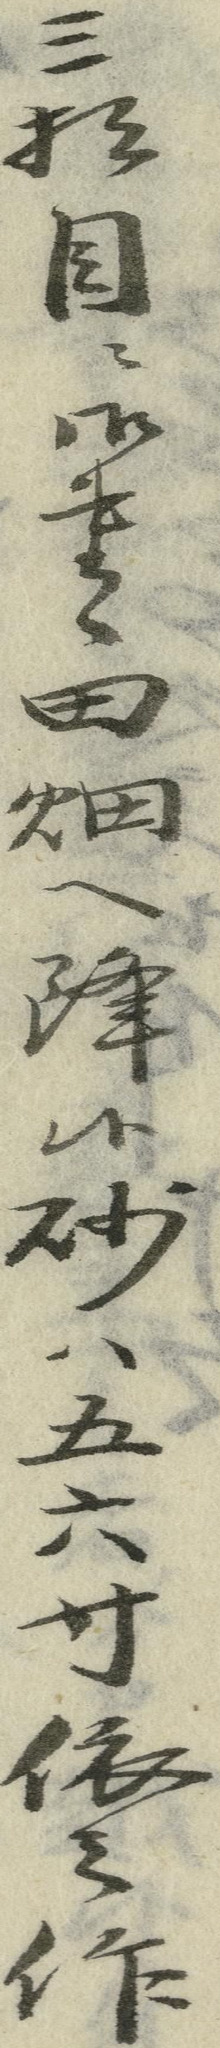三拾目ニ御座候田畑へ降候砂は五六寸依之作
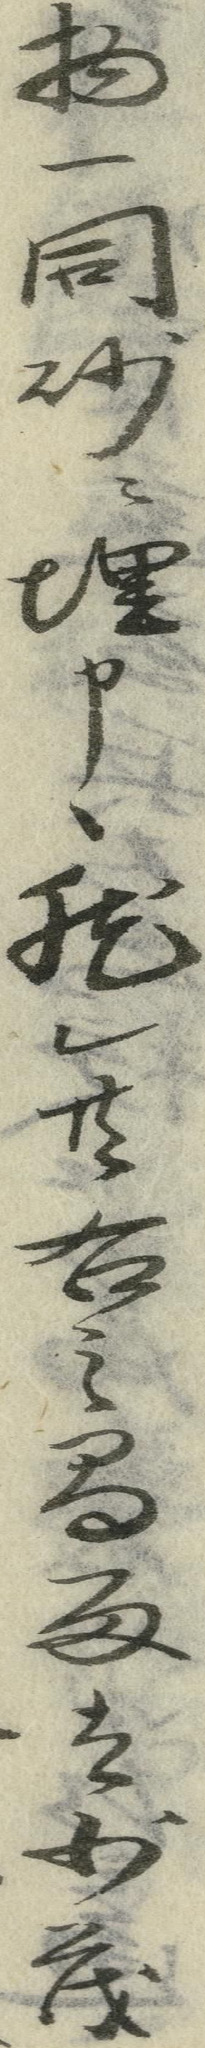物一同砂ニ埋申候然レ共右之間雨者少茂
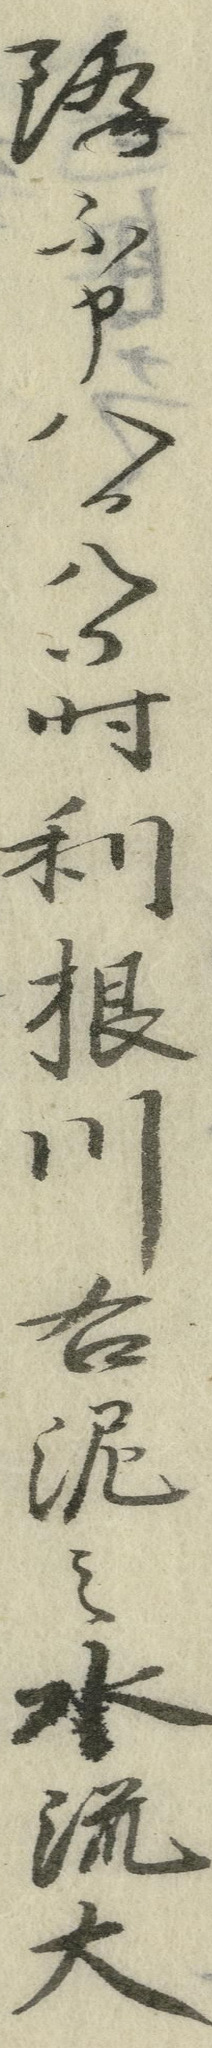降不申八日八ツ時利根川右泥之水流大
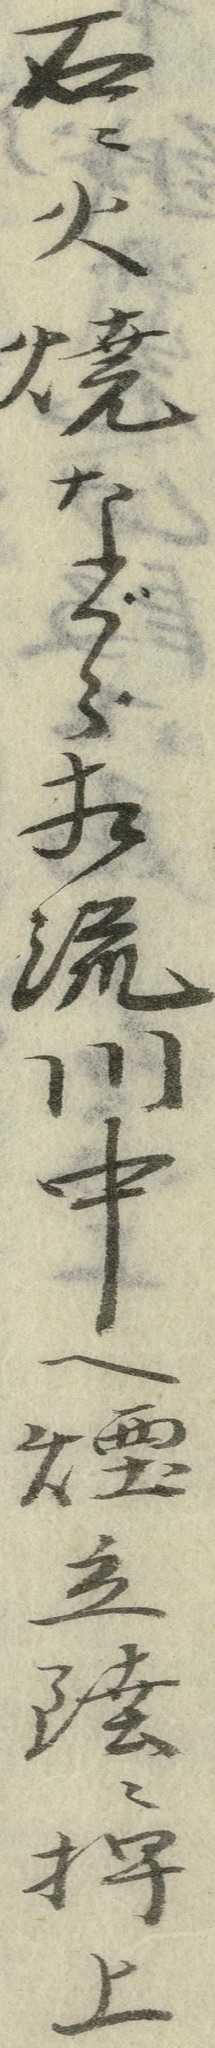石ニ火焼ながら相流川中ヘ煙立陸ニ押上
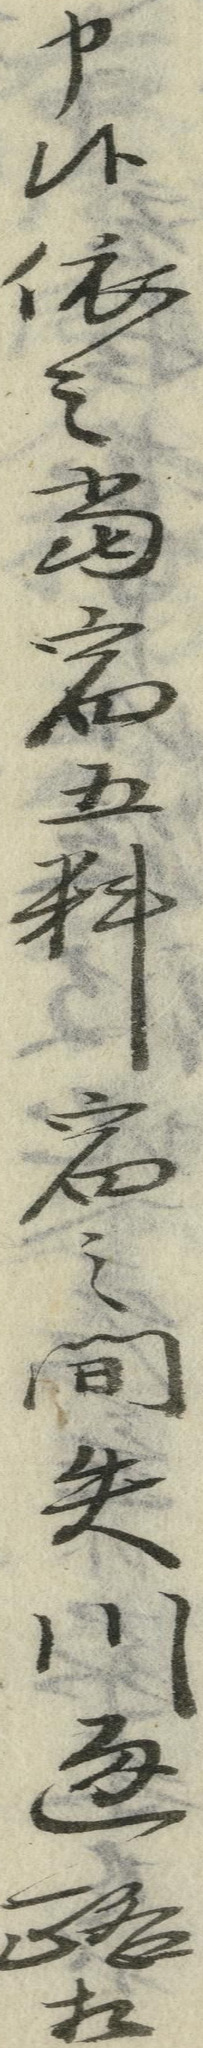申候依之当宿五料宿之間失川通路相
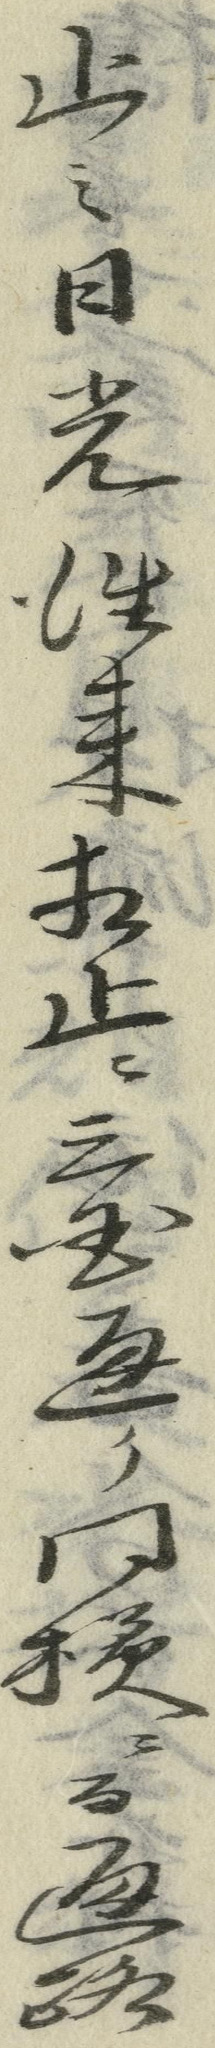止み日光往来相止ニ三国通り同様ニ而通路
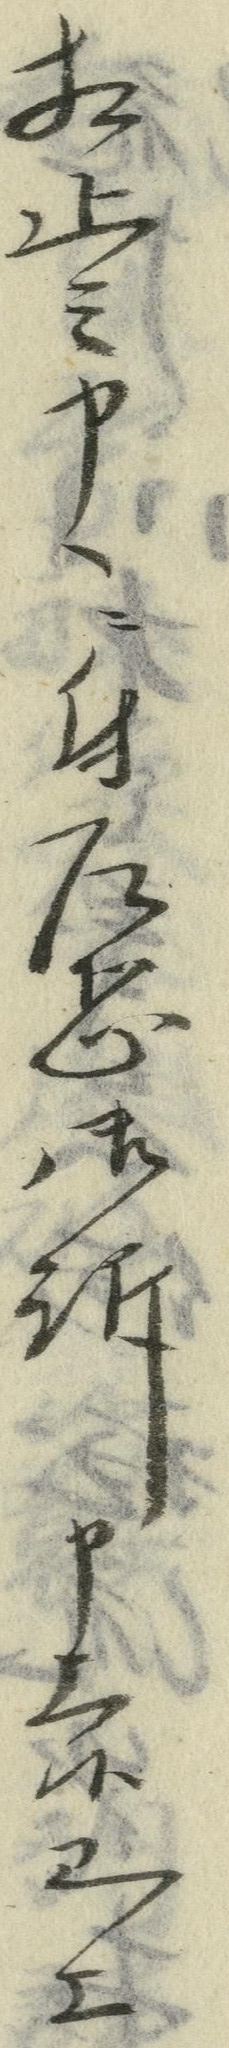相止み申候ニ付乍恐御訴申上候已上
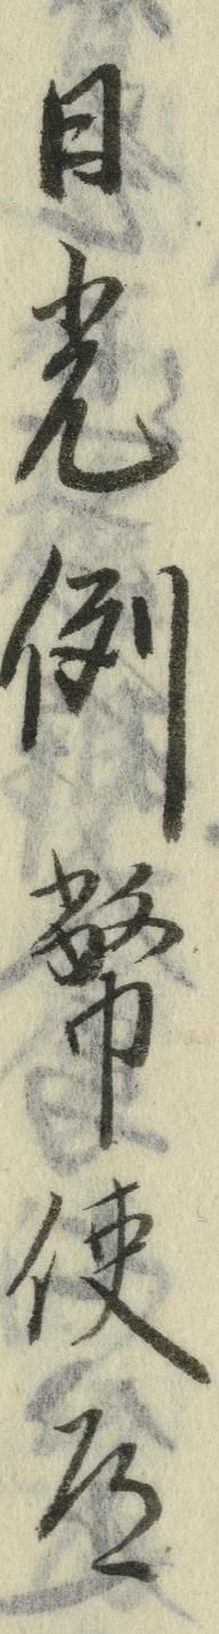日光例幣使道
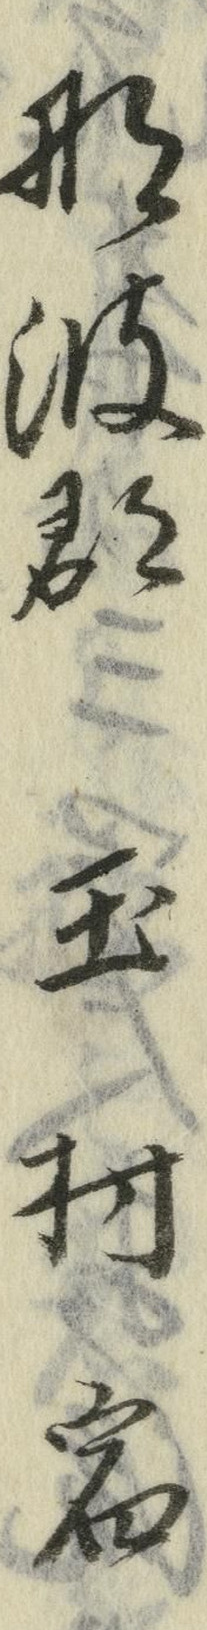那波郡玉村宿
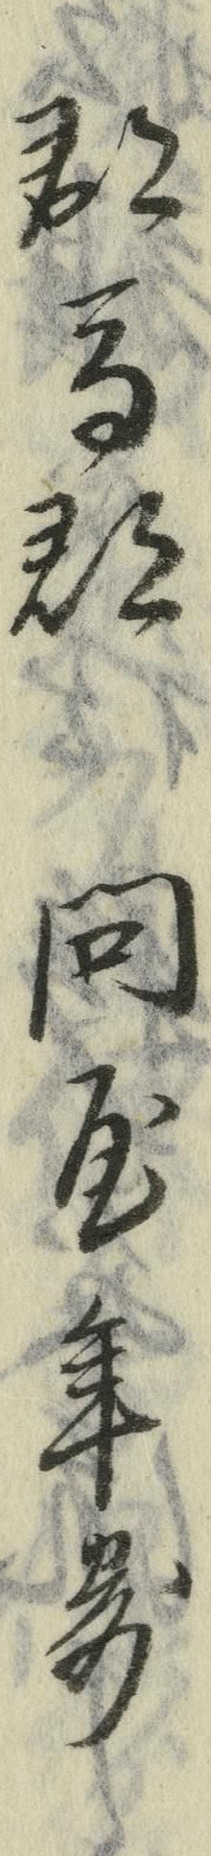郡馬郡問屋年寄
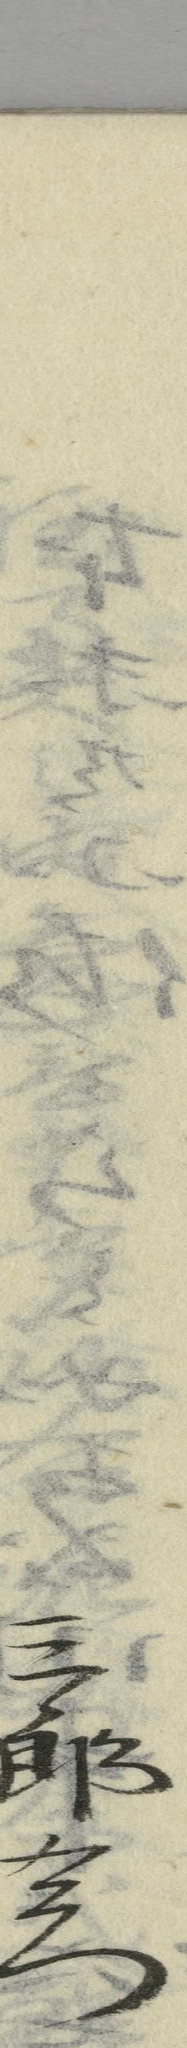三郎右衛門
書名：天明三癸卯七月信州浅間山焼出シ上州山津浪ニ付近國ヨリ御届書并訴書写
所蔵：東京大学地震研究所図書室 Earthquake Research Institute Library, The University of Tokyo, JAPAN
